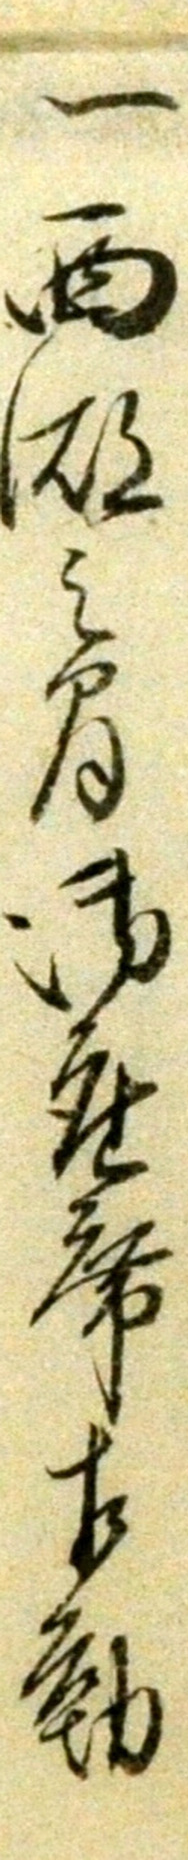一西湖之間御座席相勤
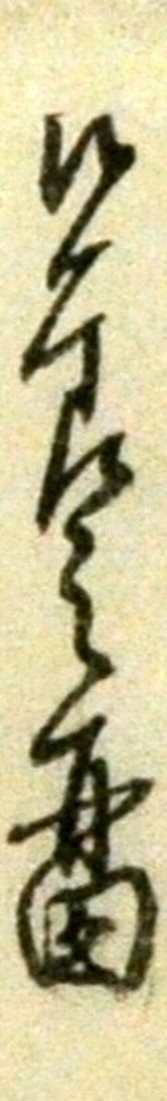候節之留
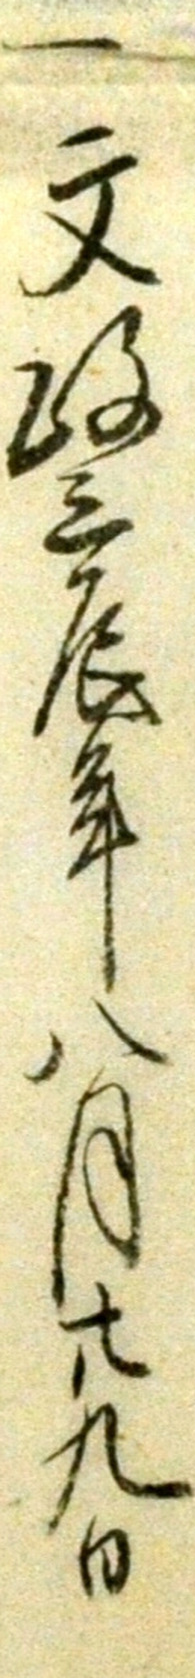文政三辰年八月廿九日
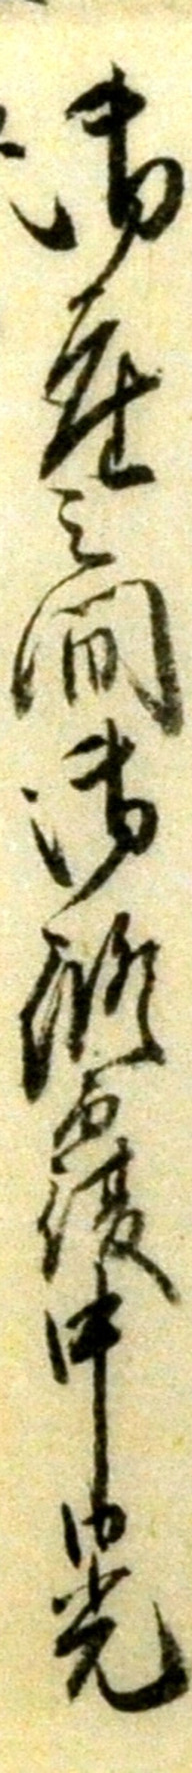御座之間御修覆中御光同
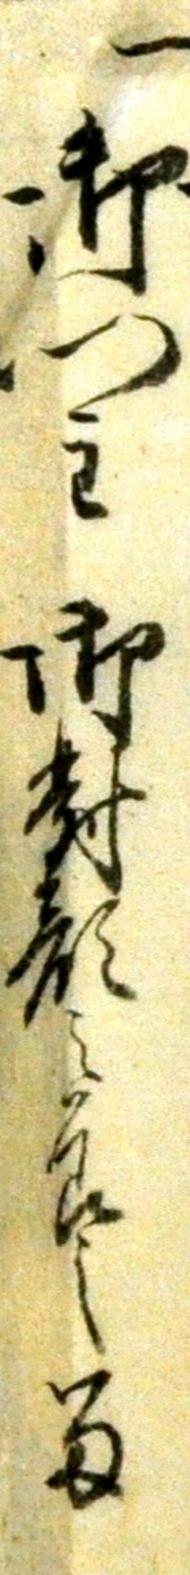一御門主御対顔之節之留
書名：雁ノ間御留目録奏者番留書目録
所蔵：伊那市立高遠町図書館・合同会社AMANE
